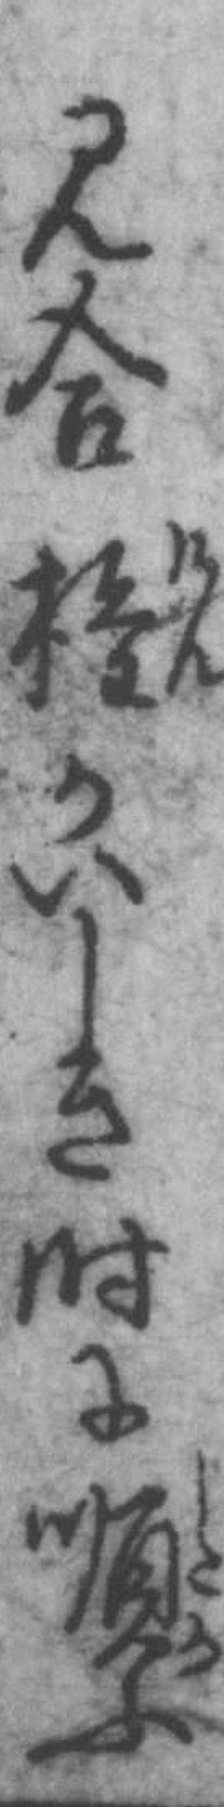見合かいしき時に順ふ

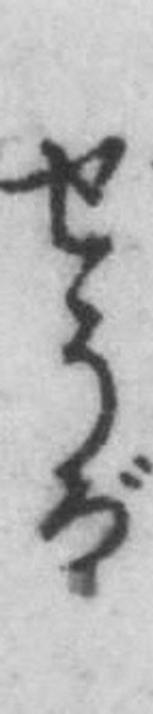せうが
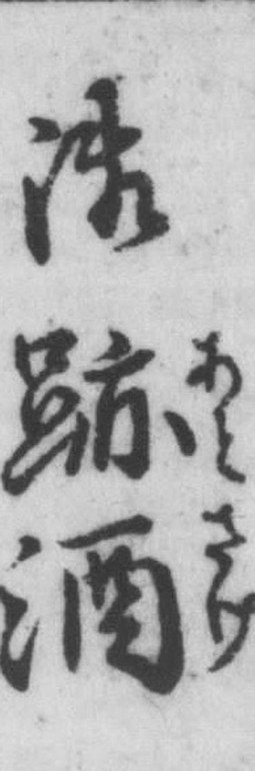御跡酒
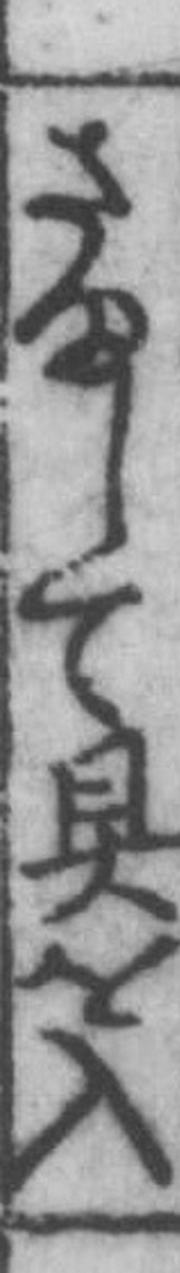さまして具を入
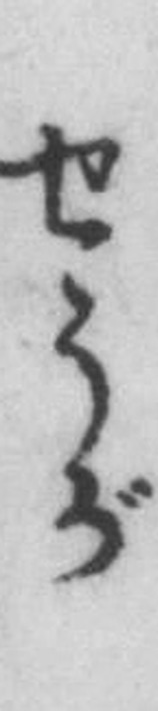せうが
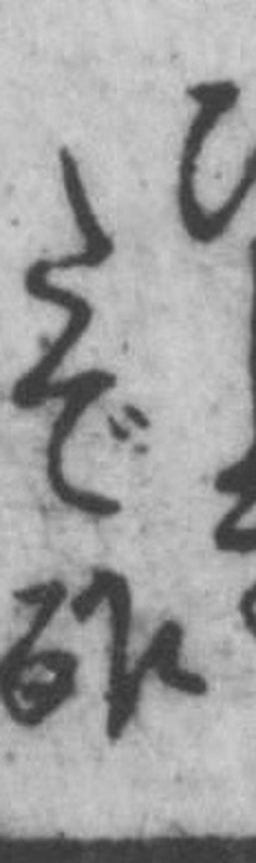たで酢
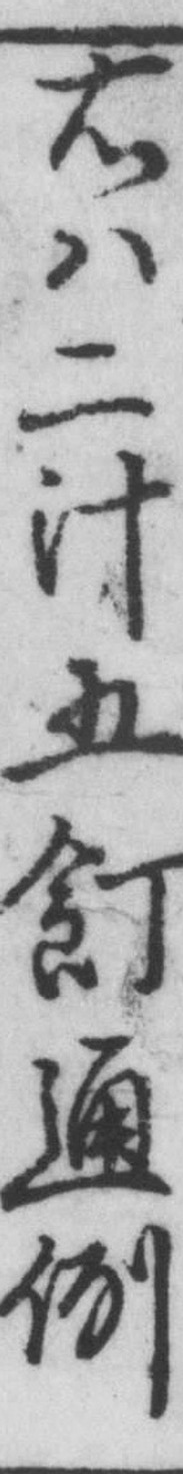右は二汁五飣通例
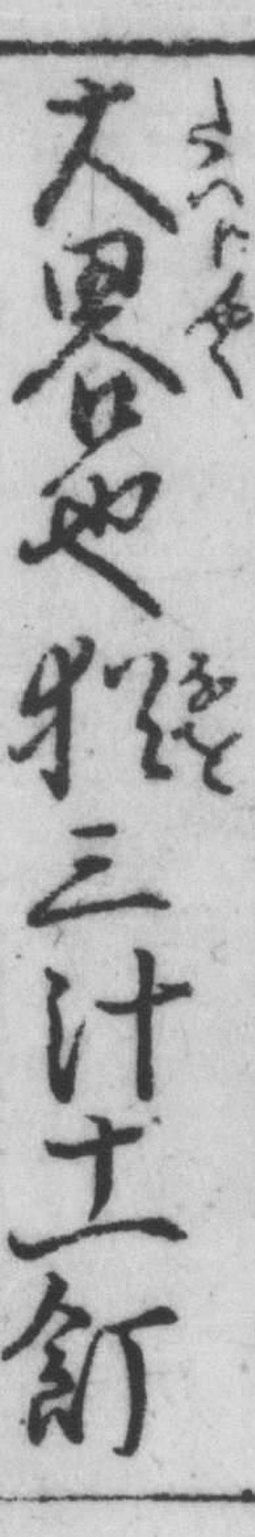大畧也三汁十一飣
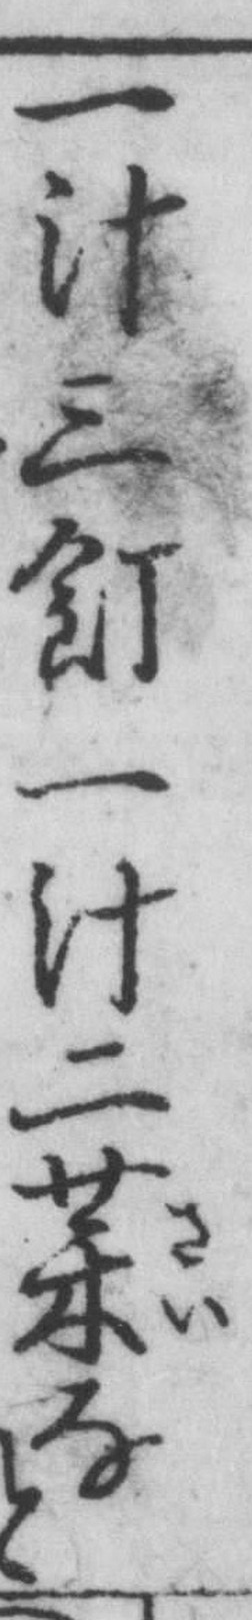一汁三飣一汁二飣なと
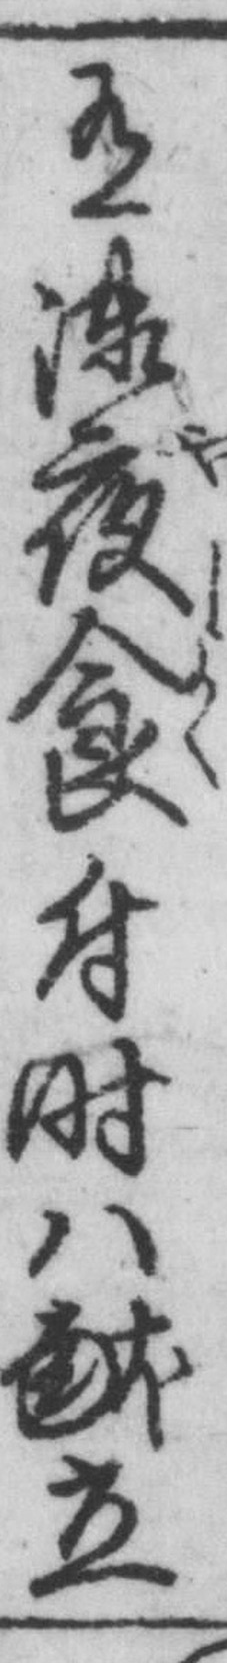並御夜食付時ハ献立
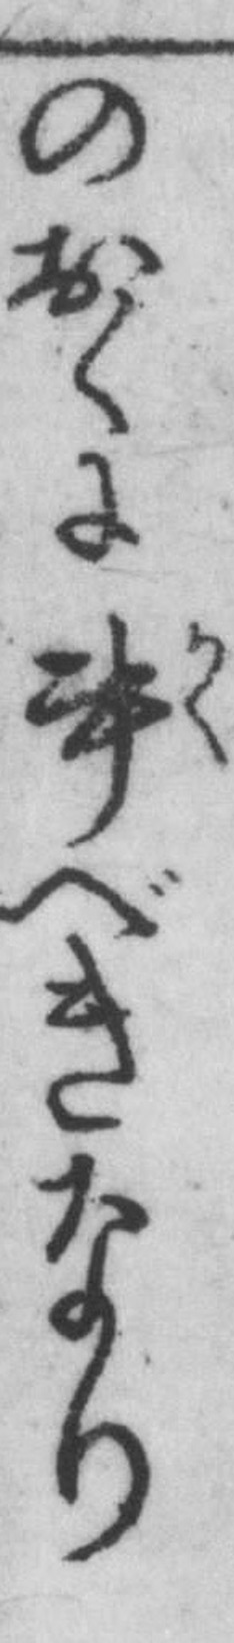のおくに書べきなり
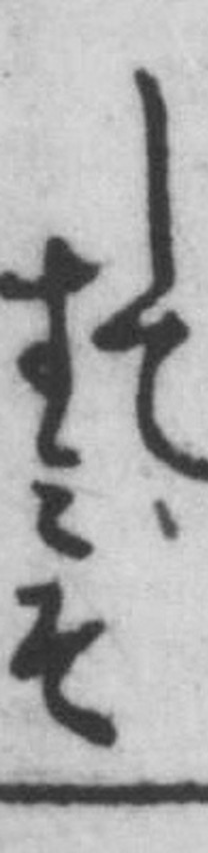すミそ
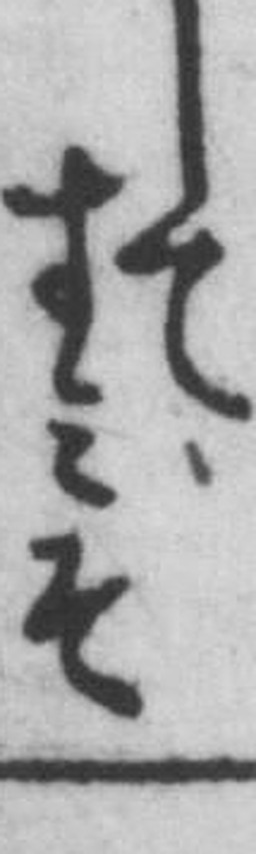すミそ
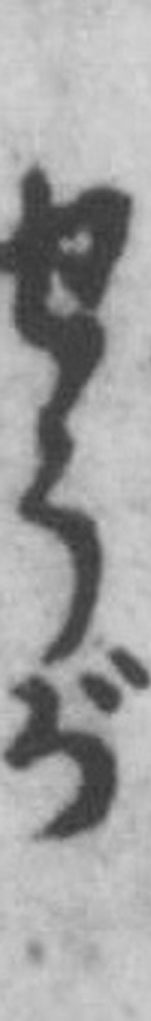せうが

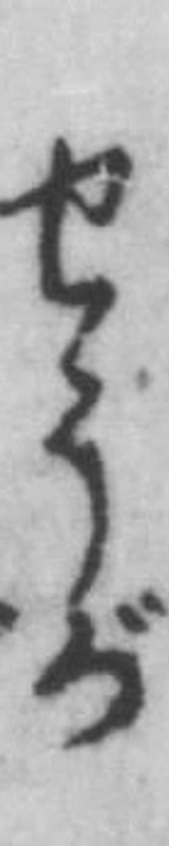せうが
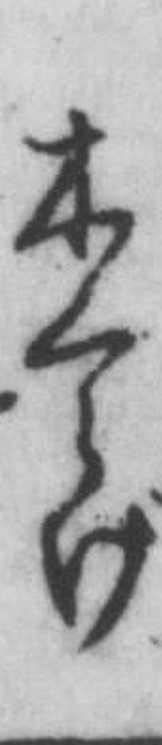木くらげ
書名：料理献立抄
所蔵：大阪府立大学学術情報センター 国文学研究資料館
